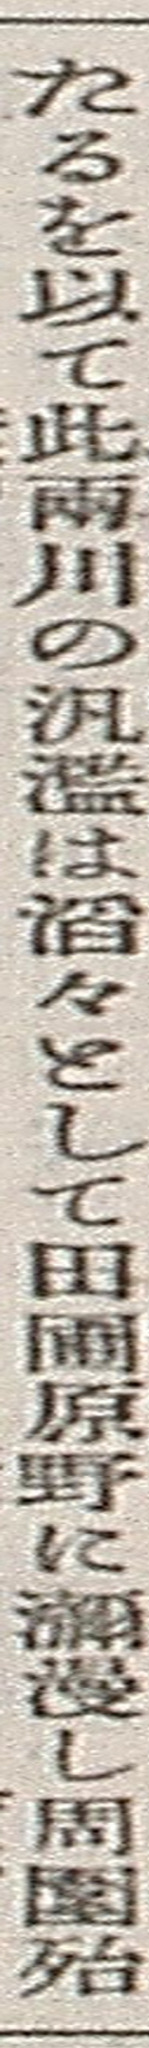たるを以て此両川の氾濫は滔々として田園原野に漲漫し周囲殆
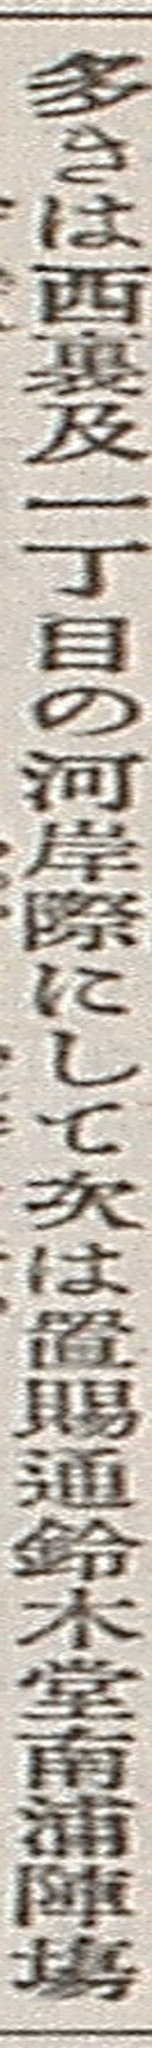多きは西裏及一丁目の河岸際にして次は置賜通鈴木堂南浦陣場
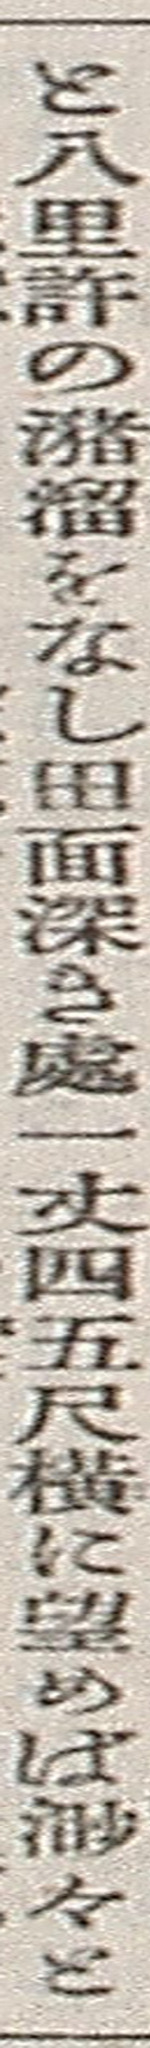ど八里許の瀦溜をなし田面深き処一丈四五尺横に望めば渺々と
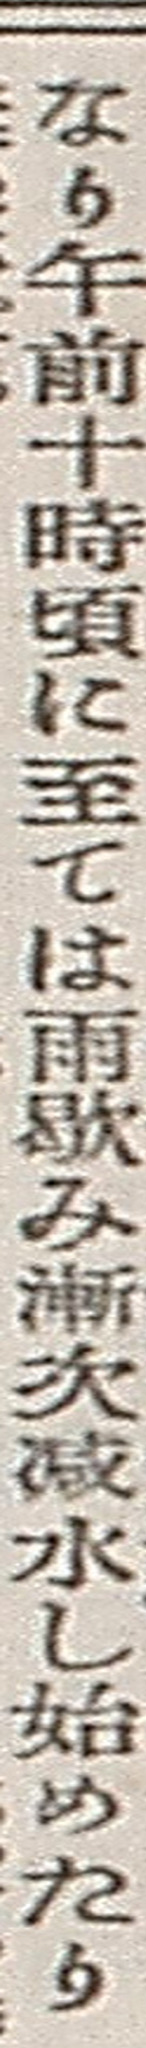なり午前十時頃に至ては雨歇み漸次減水し始めたり
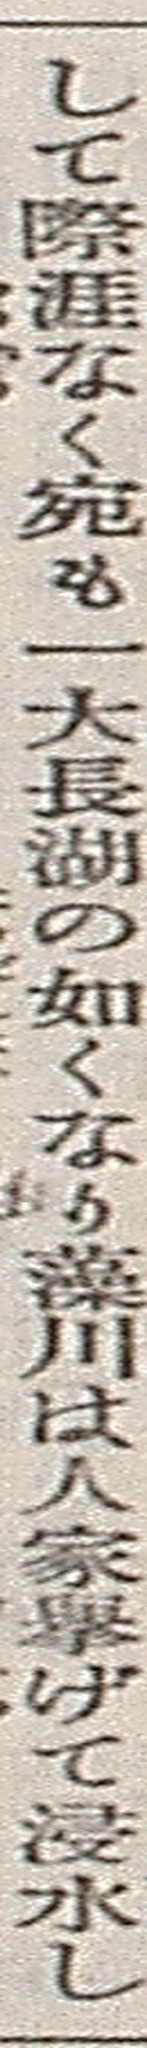して際涯なく宛も一大長湖の如くなり藻川は人家挙げて浸水し
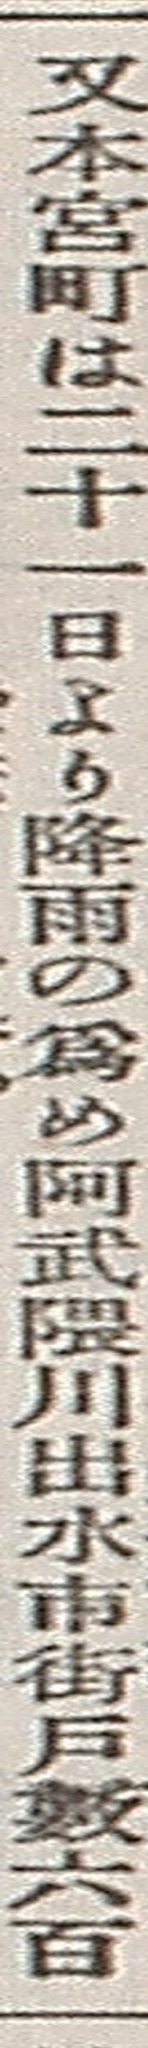又本宮町は二十一日より降雨の為め阿武隈川出水市街戸数六百
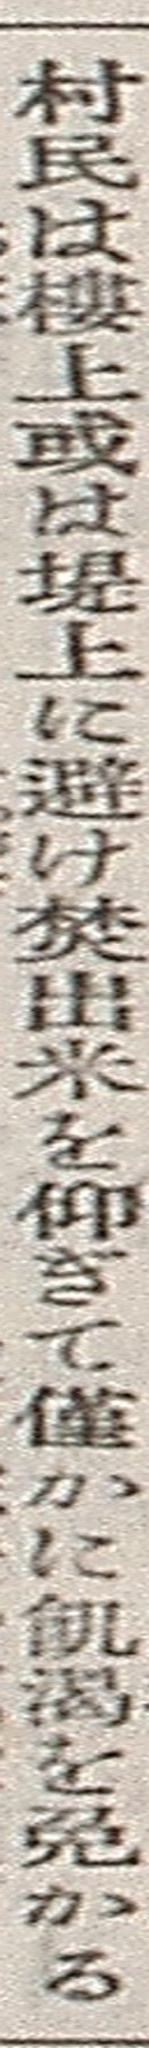村民は楼上或は堤上に避け焚出米を仰ぎて僅かに飢渇を免かる
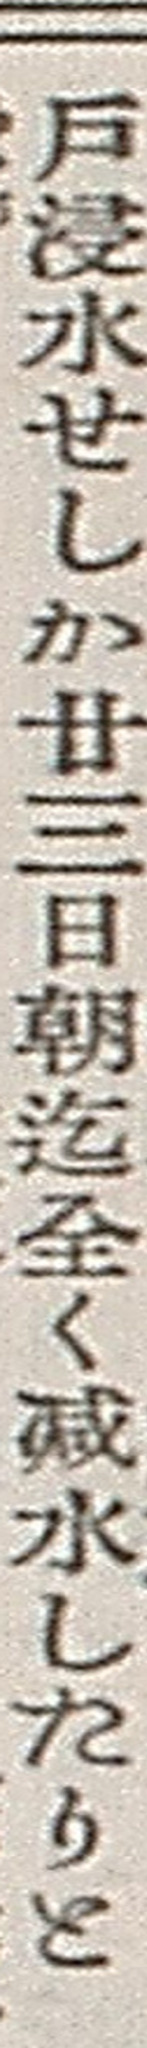戸浸水せしが廿三日朝迄全く減水したりと
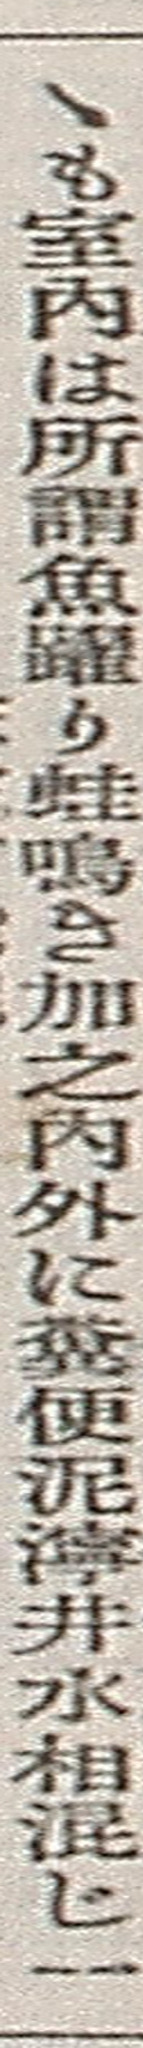ゝも室内は所謂魚躍り蛙鳴き加之内外に糞便泥濘井水相混じ一
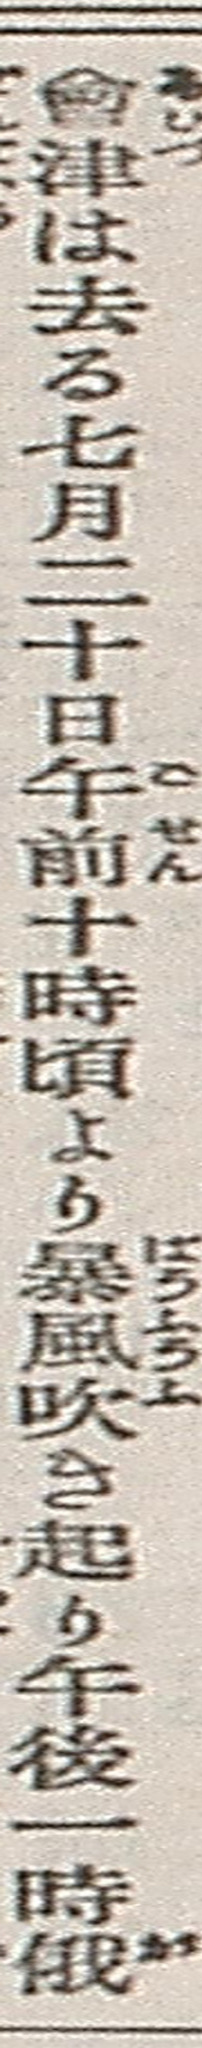会津は去る七月二十日午前十時頃より暴風吹き起り午後一時俄
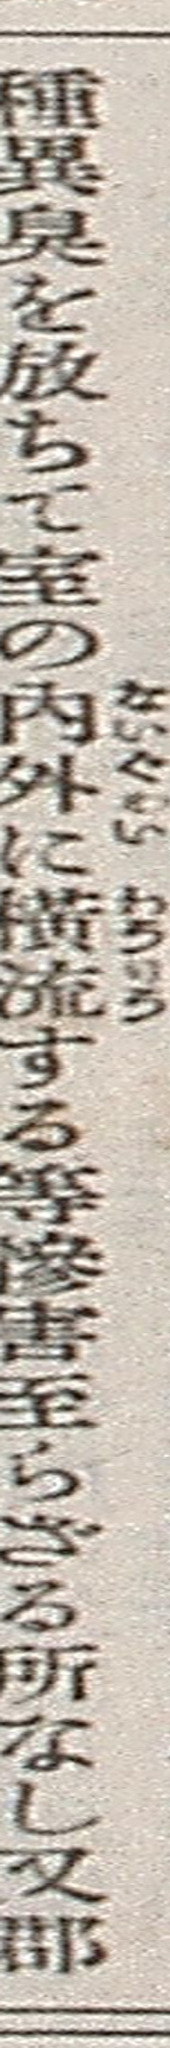種異臭を放ちて室の内外に横流する等惨害至らざる所なし又郡
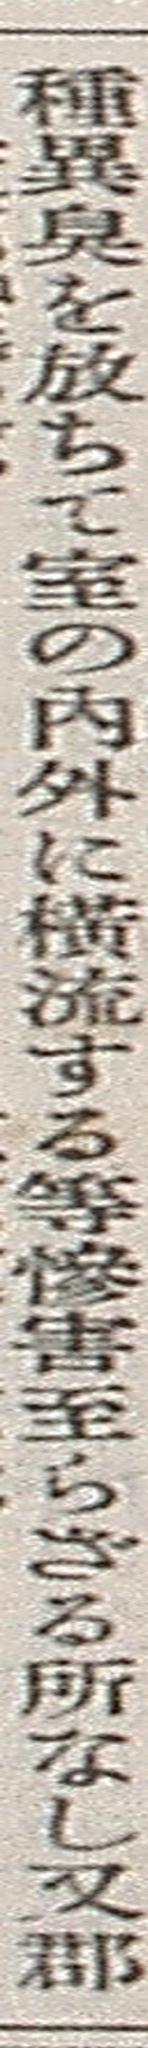種異臭を放ちて室の内外に横流する等惨害至らざる所なし又郡
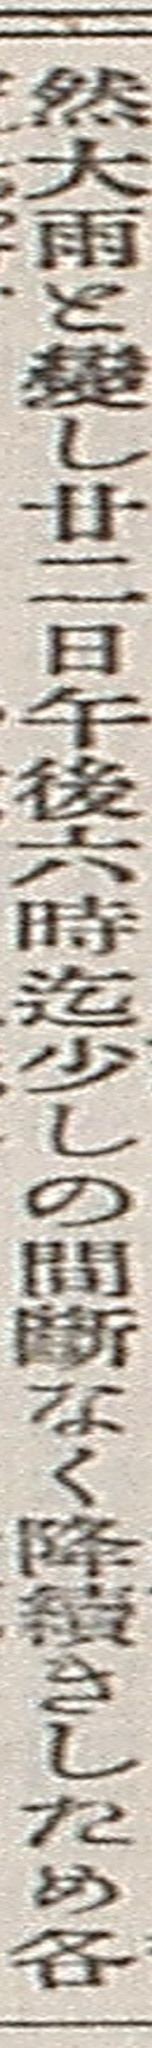然大雨と変じ廿二日午後六時迄少しの間断なく降続きしため各
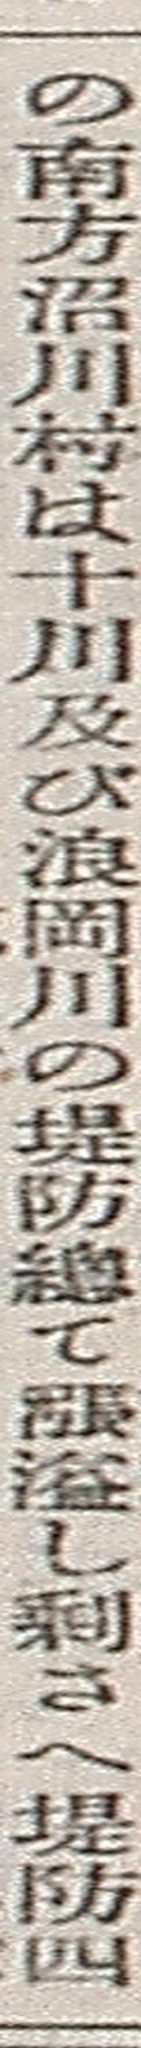の南方沼川村は十川及び浪岡川の堤防総て漲溢し剰さへ堤防四
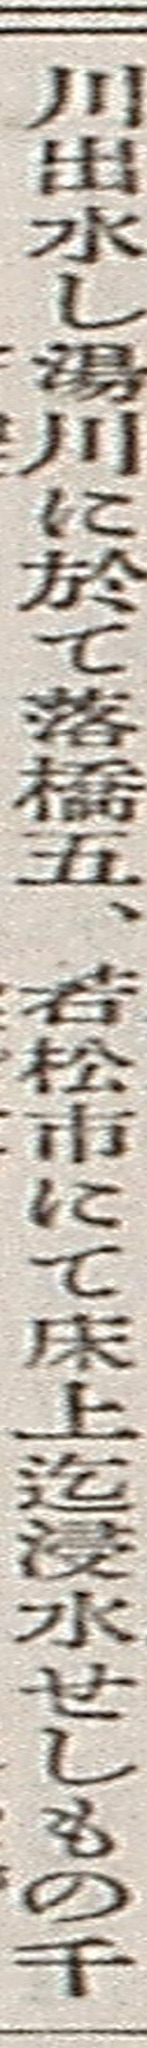川出水し湯川に於て落橋五、若松市にて床上迄浸水せしもの千
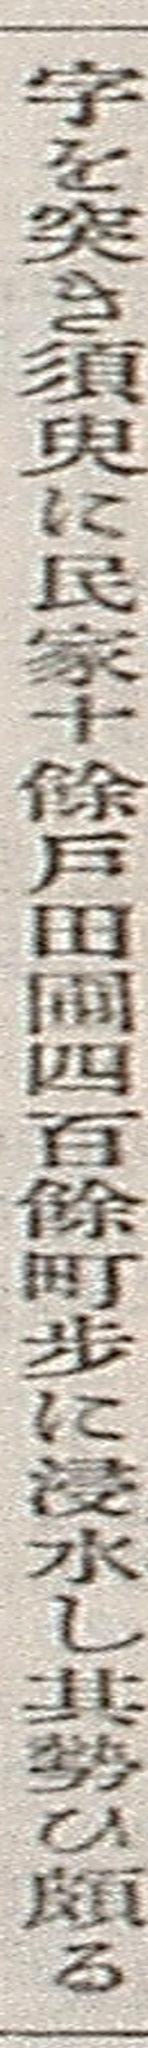字を突き須臾に民家十餘戸田圃四百餘町歩に浸水し其勢ひ頗る
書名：風俗畫報臨時増刊第百二十八號　洪水被害録（下）
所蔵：東京大学地震研究所図書室 Earthquake Research Institute Library, The University of Tokyo, JAPAN
